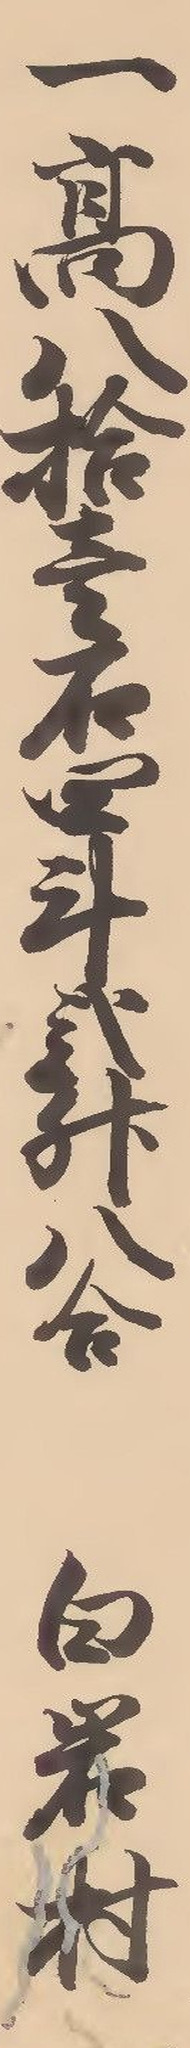一高八拾壱石四斗弐升八合白岩村
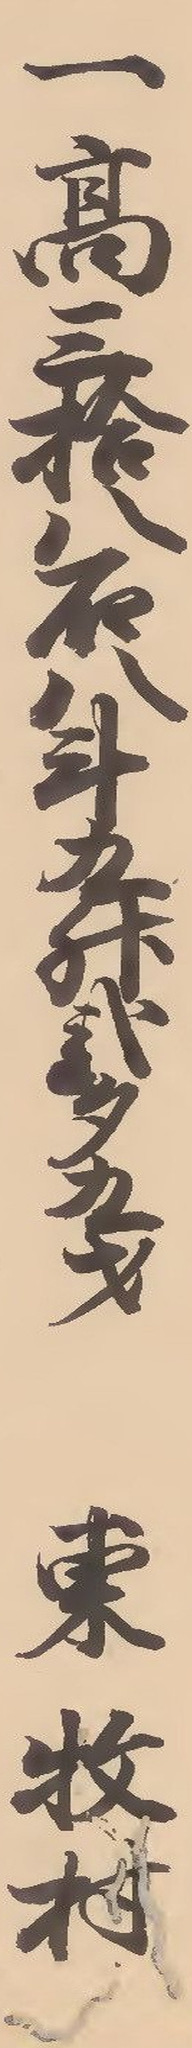一高三拾八石八斗九升弐勺九才東牧村
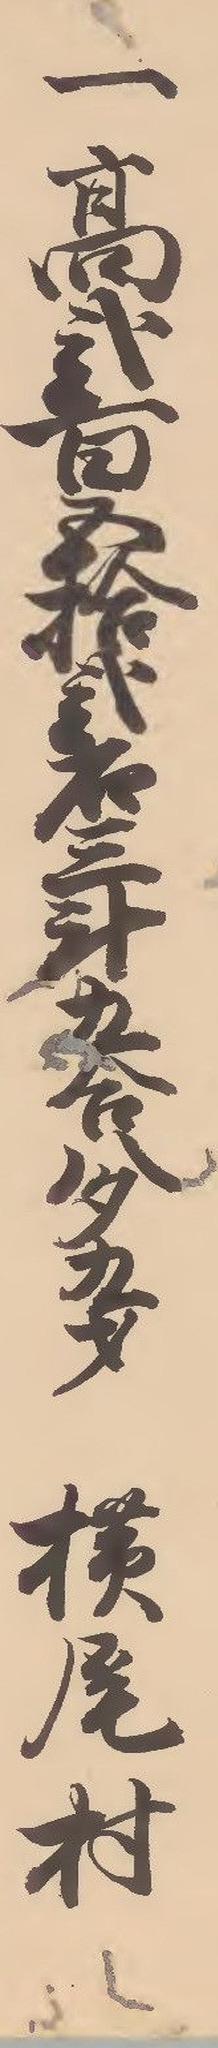一高弐百五拾弐石三斗九合八勺九才横尾村
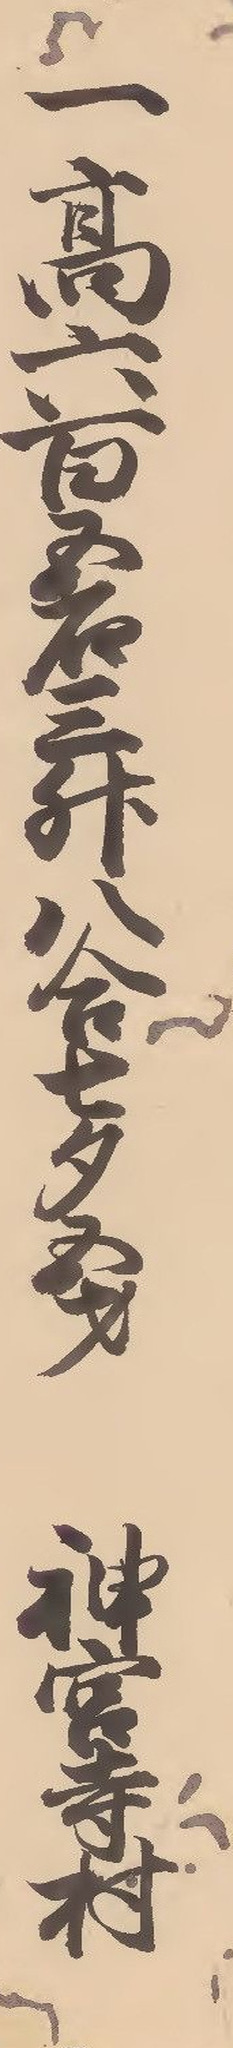一高六百五石三升八合七勺五才神宮寺村
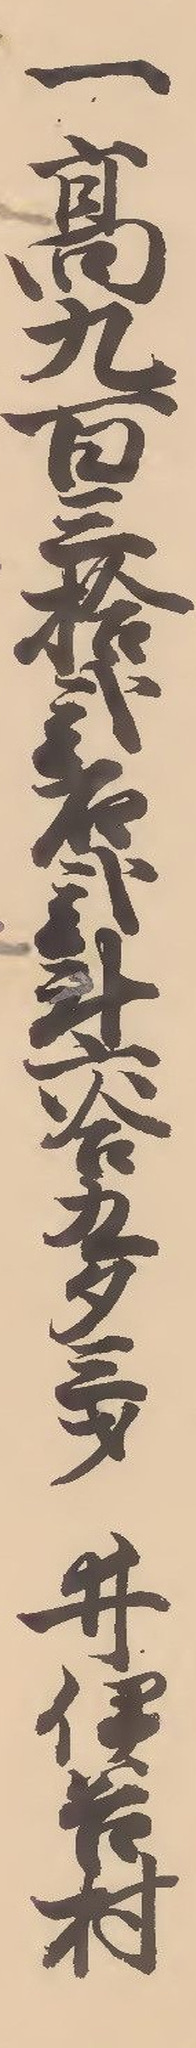一高九百三拾弐石弐斗六合九勺三才井伊谷村

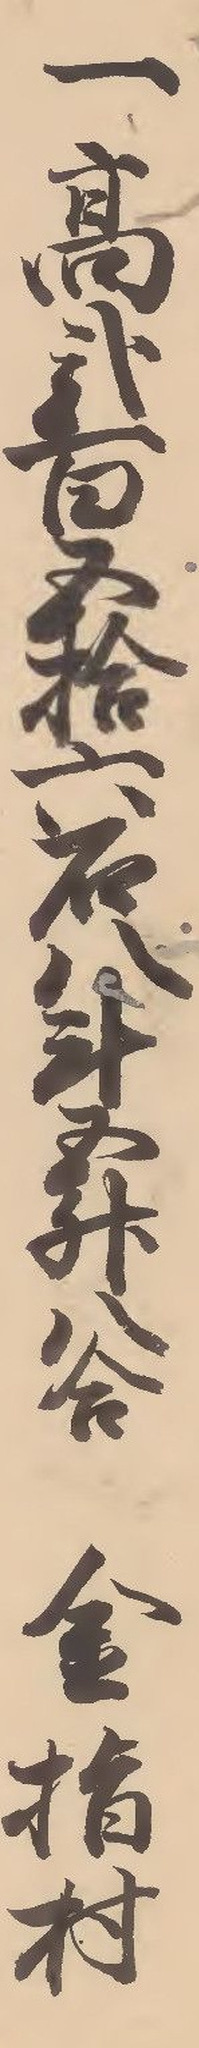一高弐百五拾六石八斗五升八合金指村
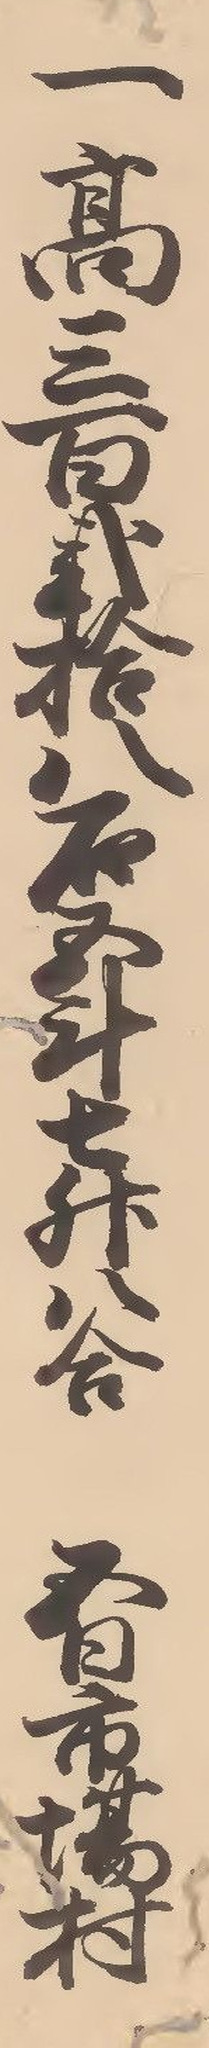一高三百弐拾八石五斗七升八合五日市場村
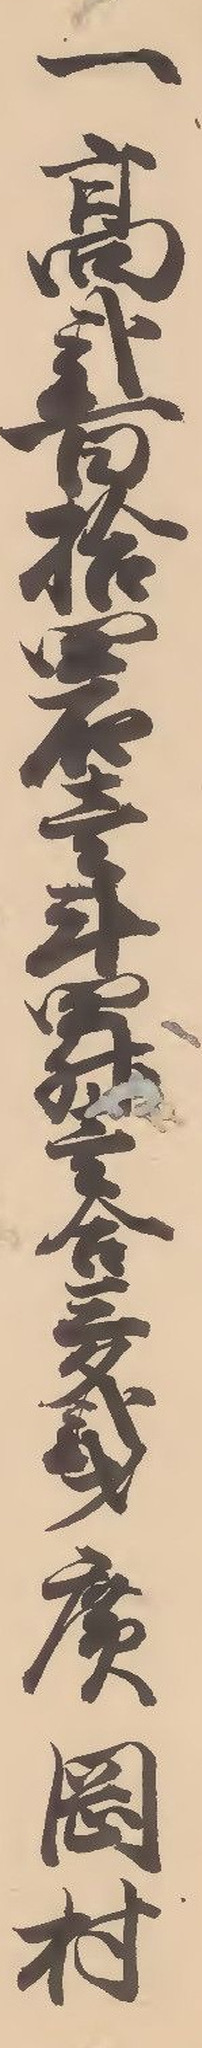一高弐百拾四石壱斗四升壱合三勺弐才広岡村
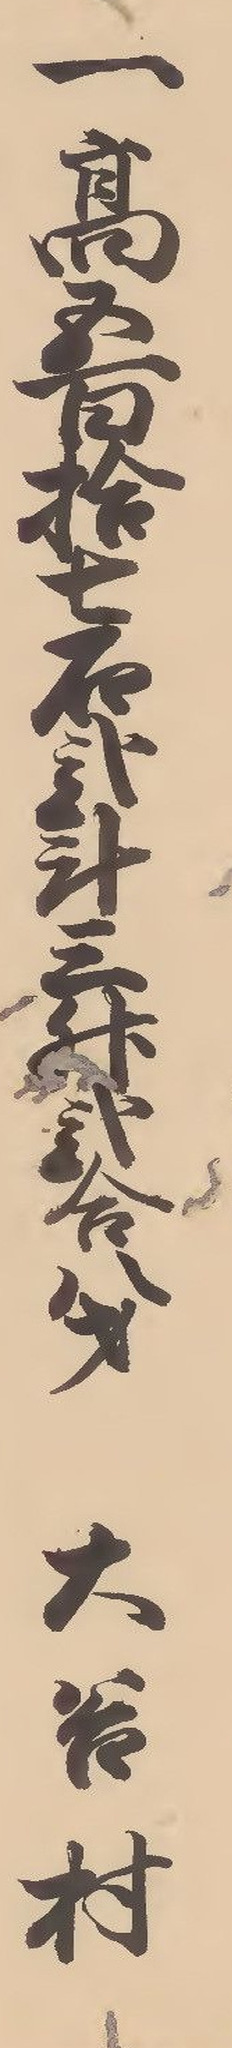一高五百拾七石弐斗三升弐合八才大谷村
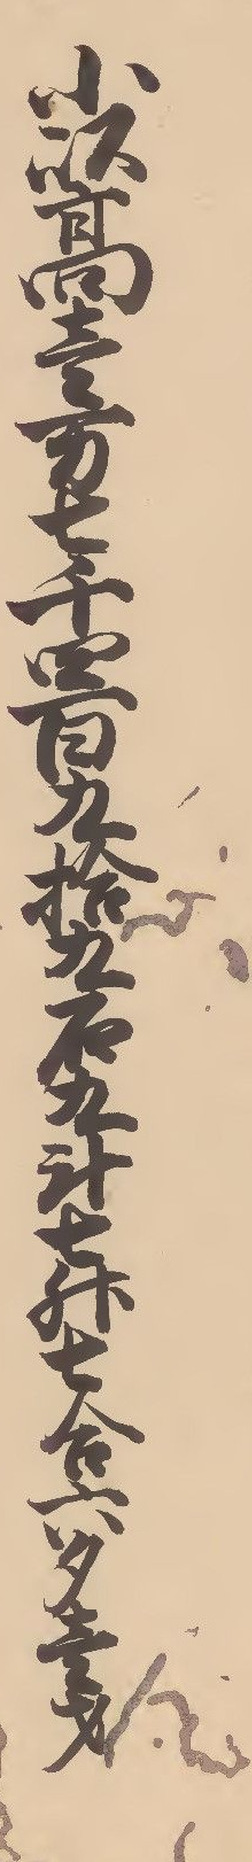小以高壱万七千四百九拾九石九斗七升七合六勺壱才

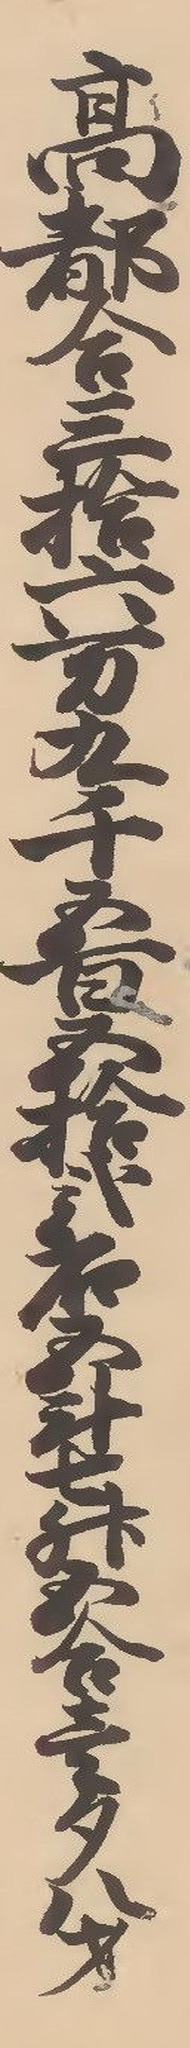高都合三拾六万九千五百五拾弐石五斗七升五合壱勺八才
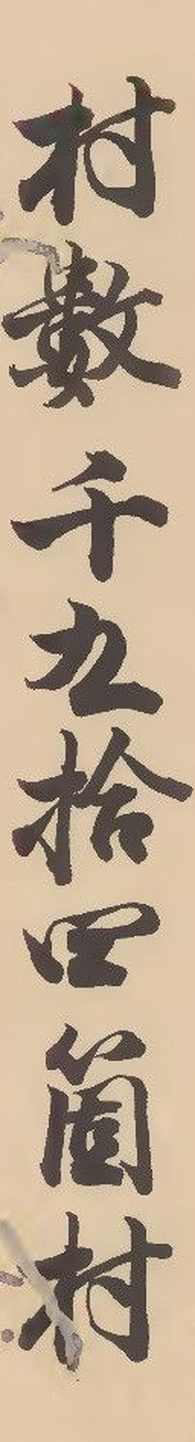村数千九拾四箇村
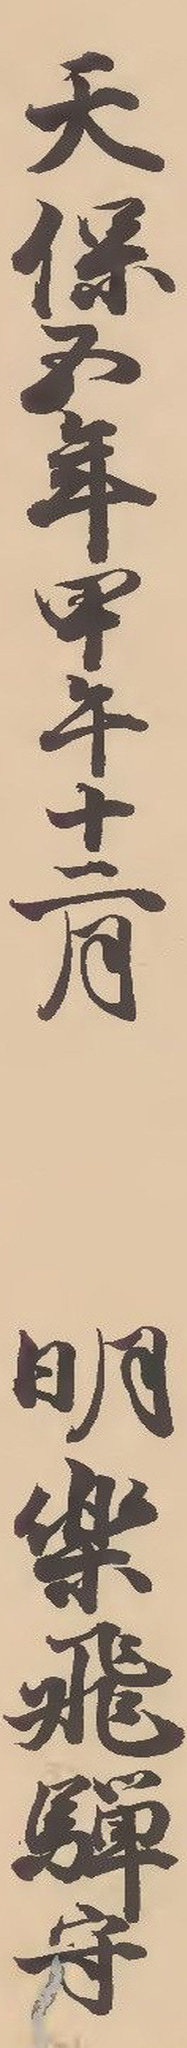天保五年甲午十二月明楽飛騨守
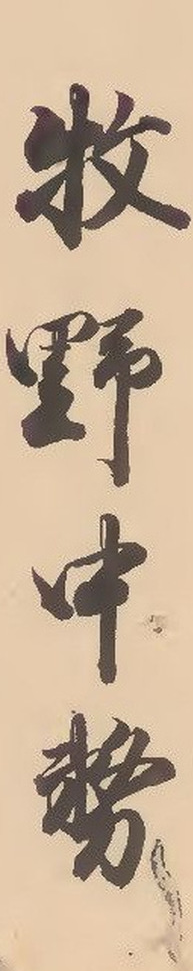牧野中務
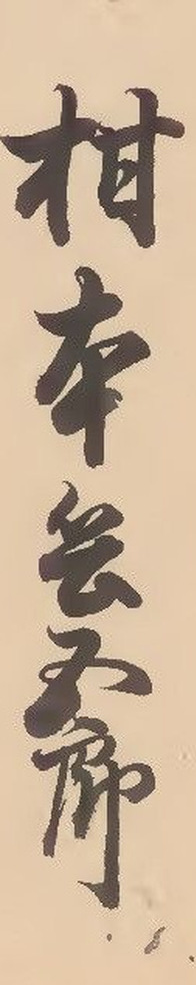柑本兵五郎
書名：遠江国郷帳
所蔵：国立公文書館 National Archives of Japan
